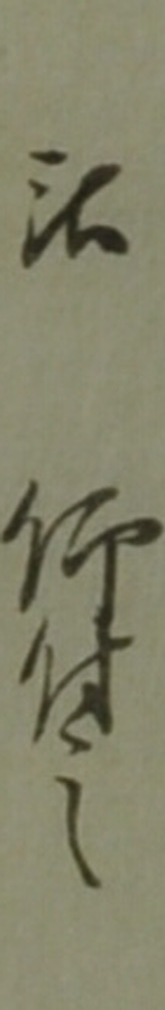被仰付之
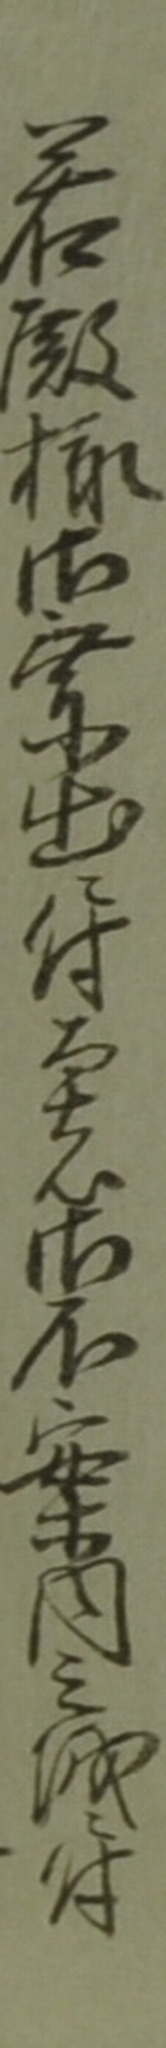若殿様御乗出ニ付志御不案内之儀ニ付
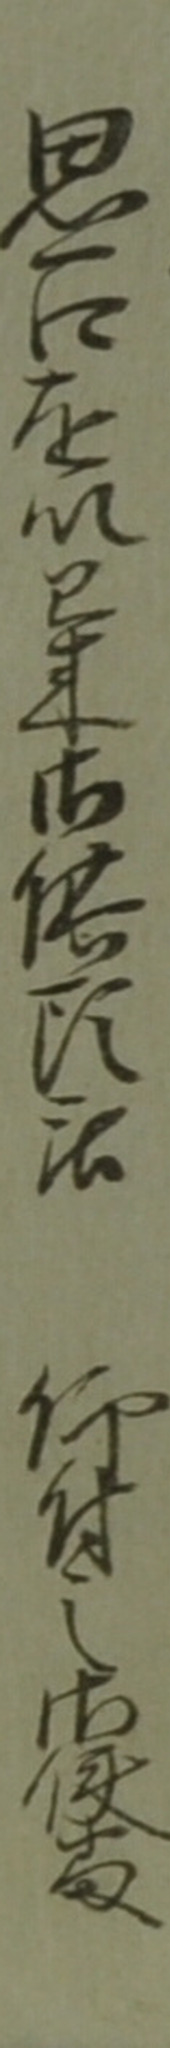思召を以◻︎御供頭被仰付之御使両
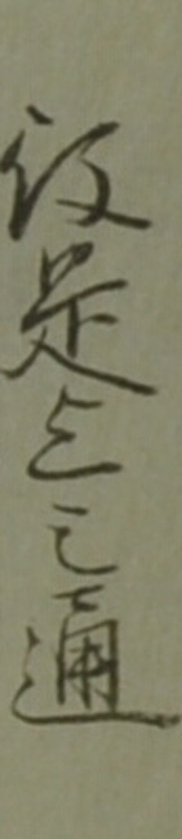役是迄之通
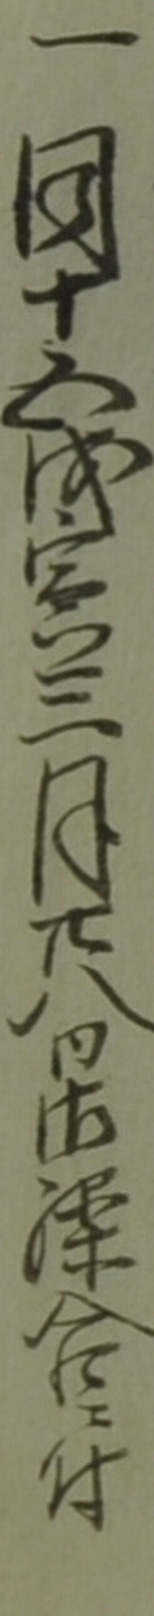一同十五戊寅三月廿八日御繰合ニ付
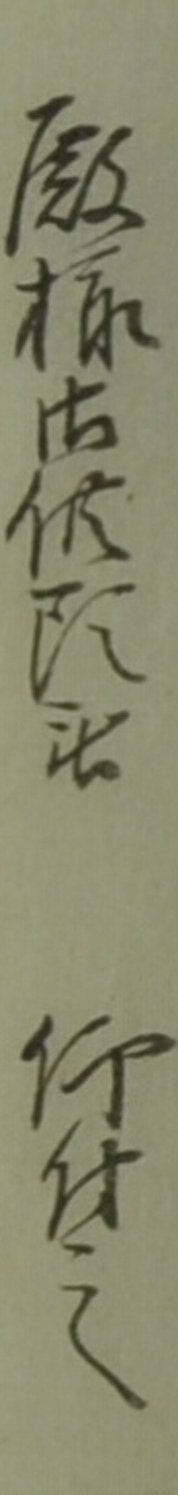殿様御供頭被仰付之
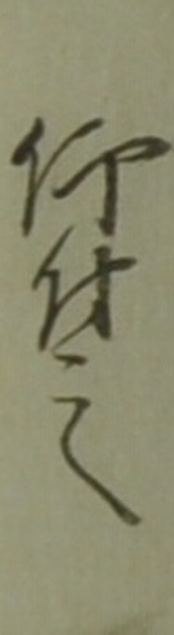仰付之

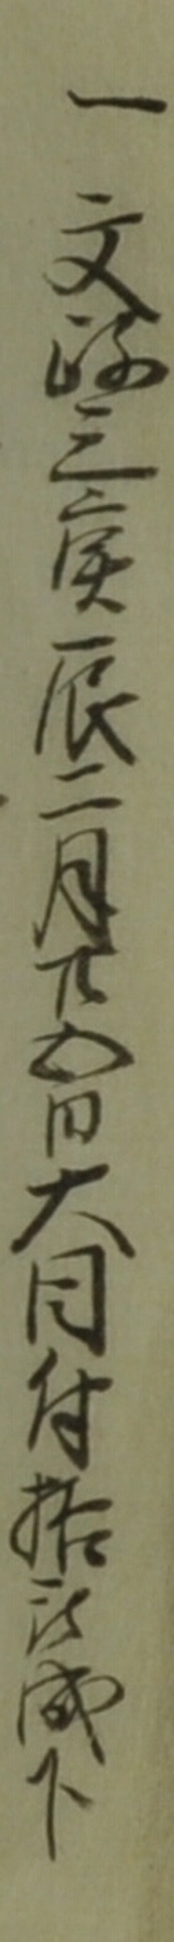一文政三庚辰二月廿五日大目付格被成下
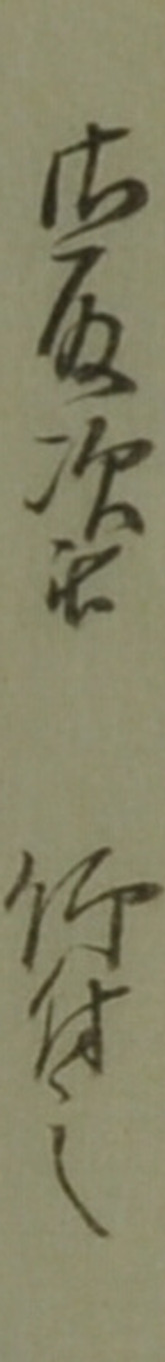御取次被仰付之
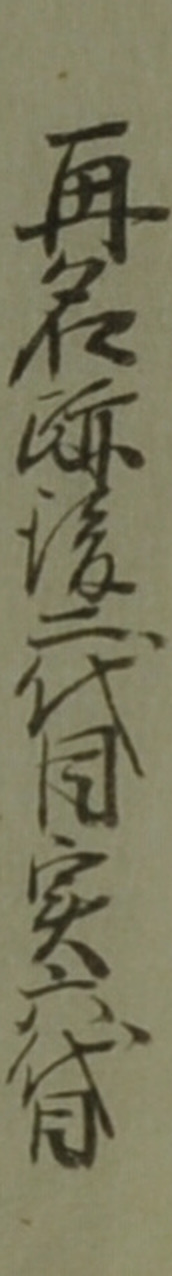再名跡後二代目実六代目
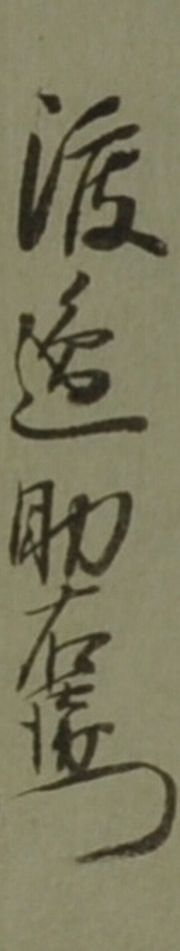渡辺助右衛門
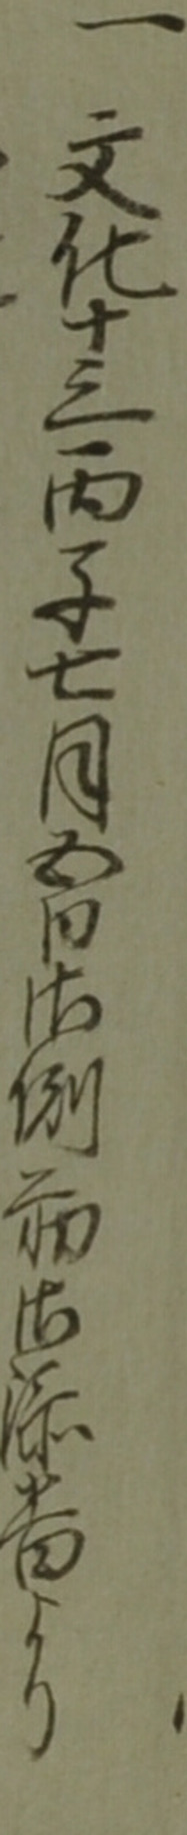一文化十三丙子七月五日御側勤御添番より
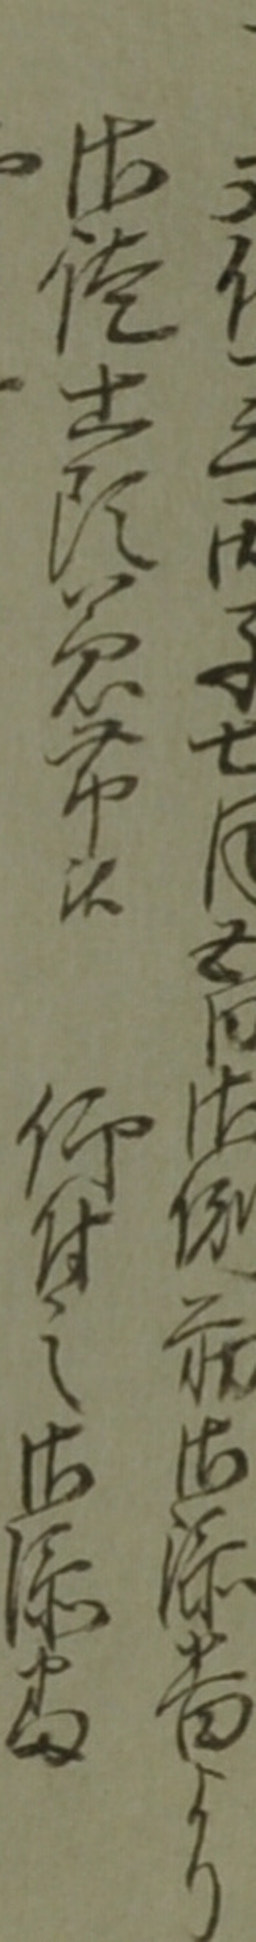御徒士頭兼帯仰付之御添番
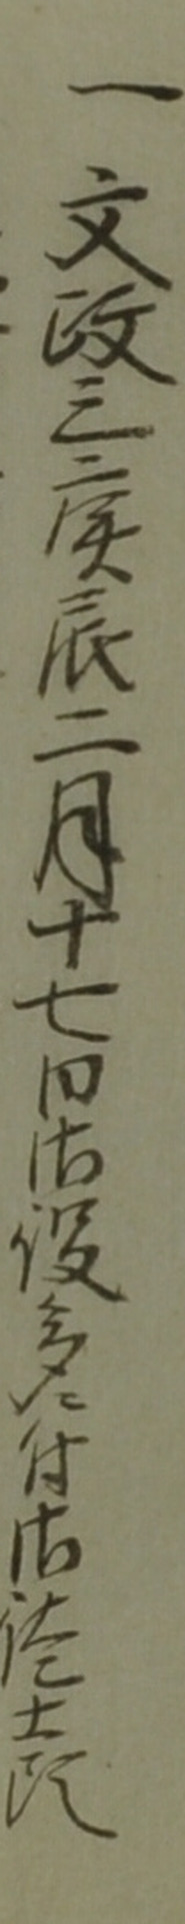一文政三庚辰二月十七日御役多ニ付御徒士頭
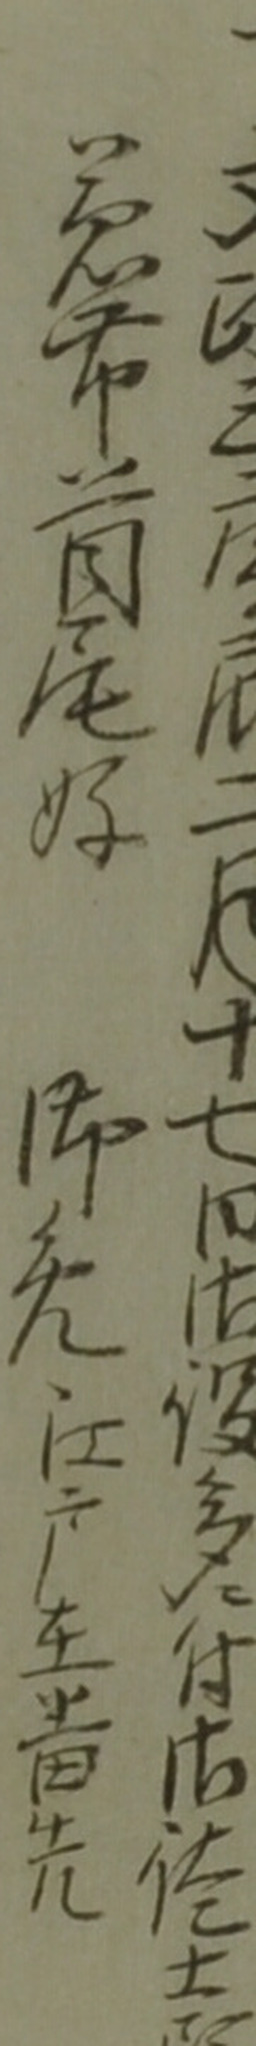兼帯首尾好御免江戸在番先
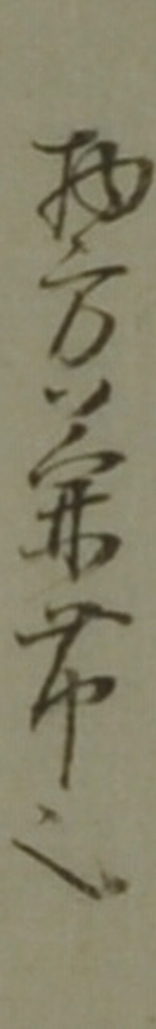物方兼帯也
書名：諸御役代々録（六）
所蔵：伊那市立高遠町図書館・合同会社AMANE
